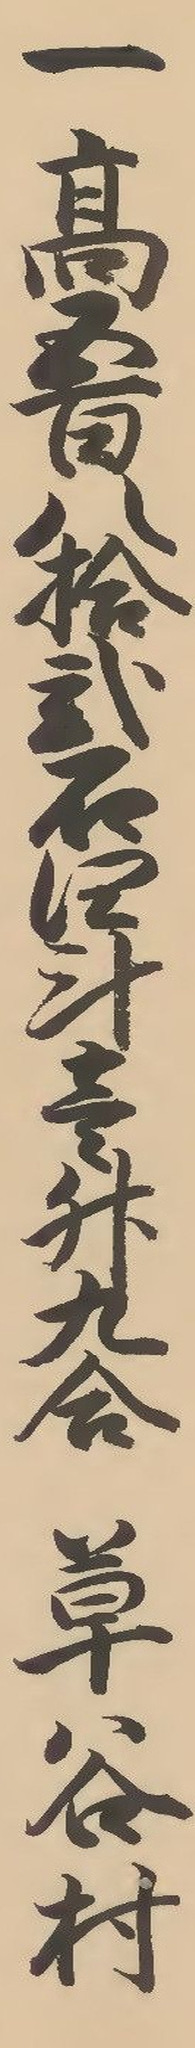一高五百八拾弐石四斗壱升九合草谷村
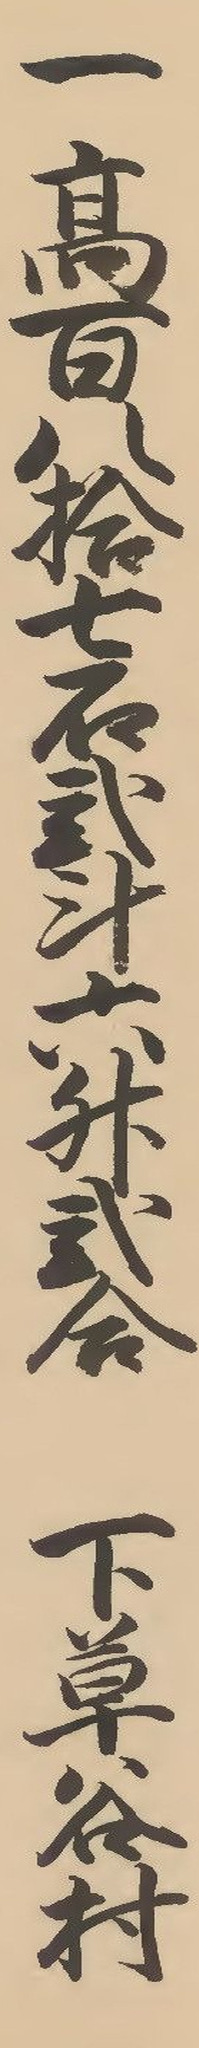一高百八拾七石弐斗六升弐合下草谷村
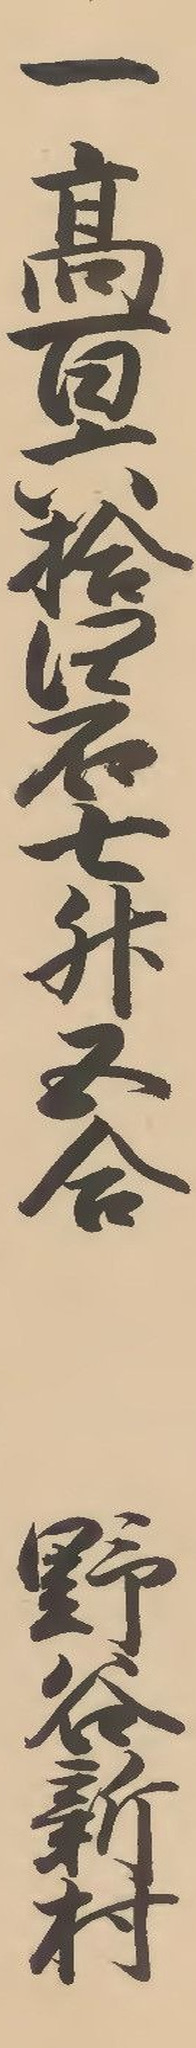一高百六拾四石七升五合野谷新村
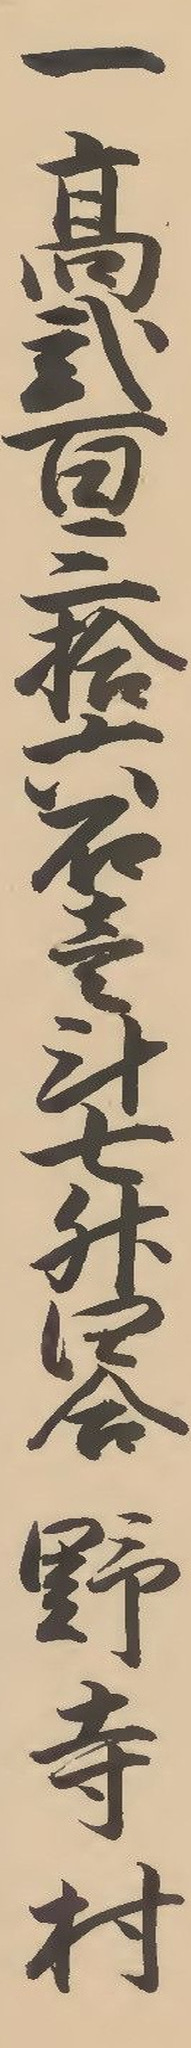一高弐百三拾六石壱斗七升四合野寺村
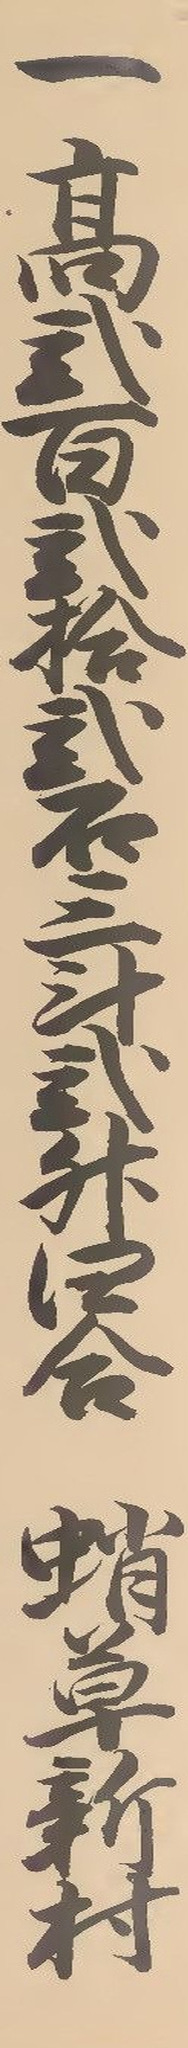一高弐百弐拾弐石三斗弐升四合蛸草新村
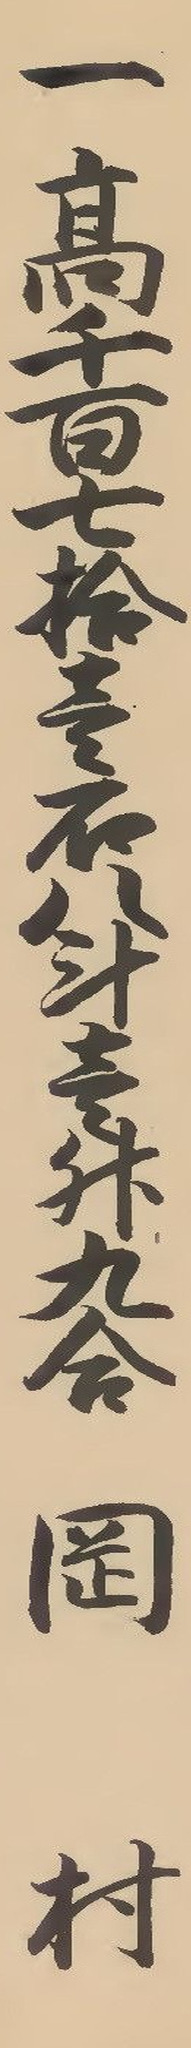一高千百七拾壱石八斗壱升九合岡村
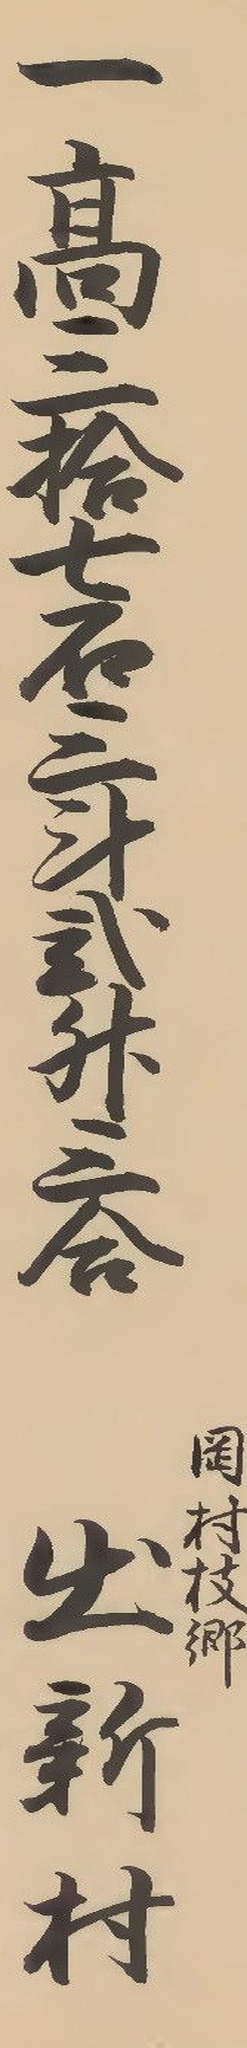一高三拾七石三斗弐升三合出新村
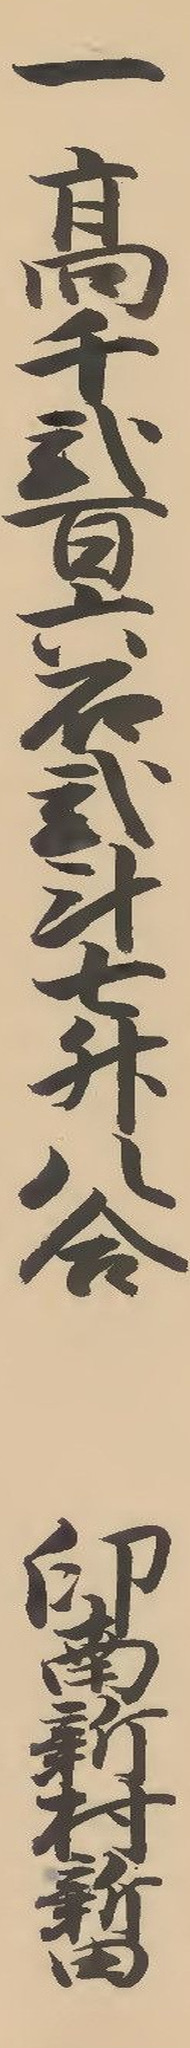一高千弐百六石弐斗七升八合印南新村新田

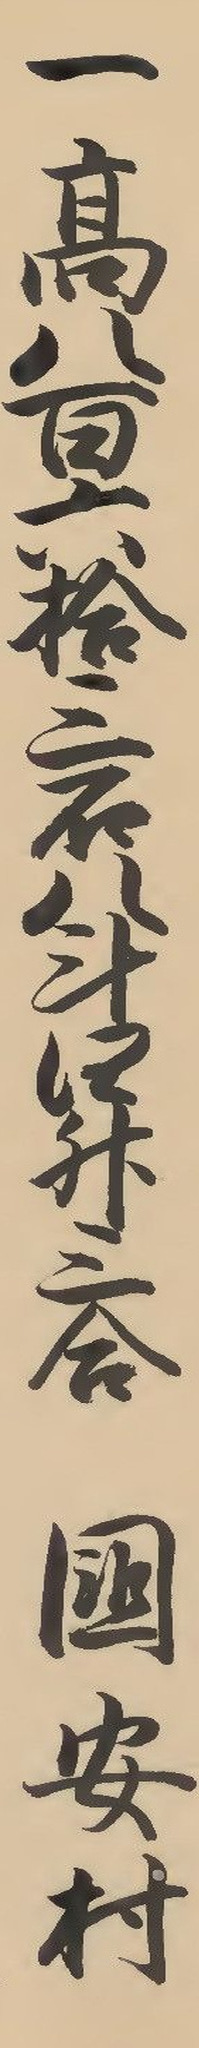一髙八百六拾三石八斗四升三合國安村
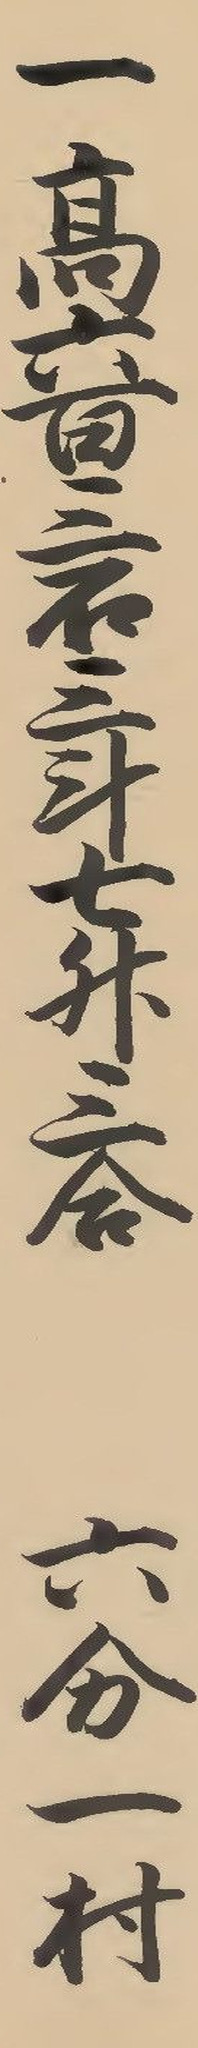一髙六百三石三斗七升三合六分一村
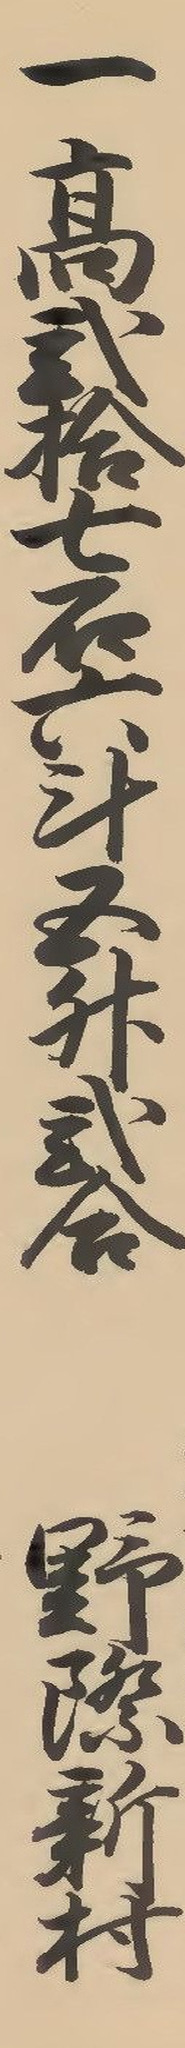一髙弐拾七石六斗五升弐合野際新村
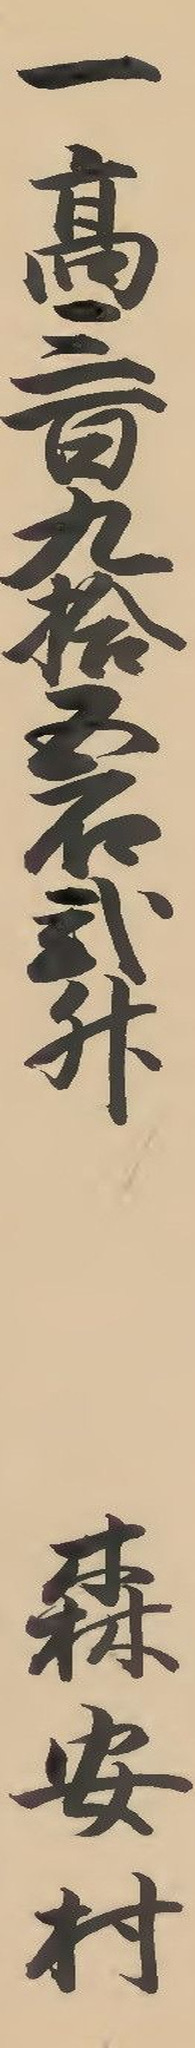一髙三百九拾五石弐升森安村
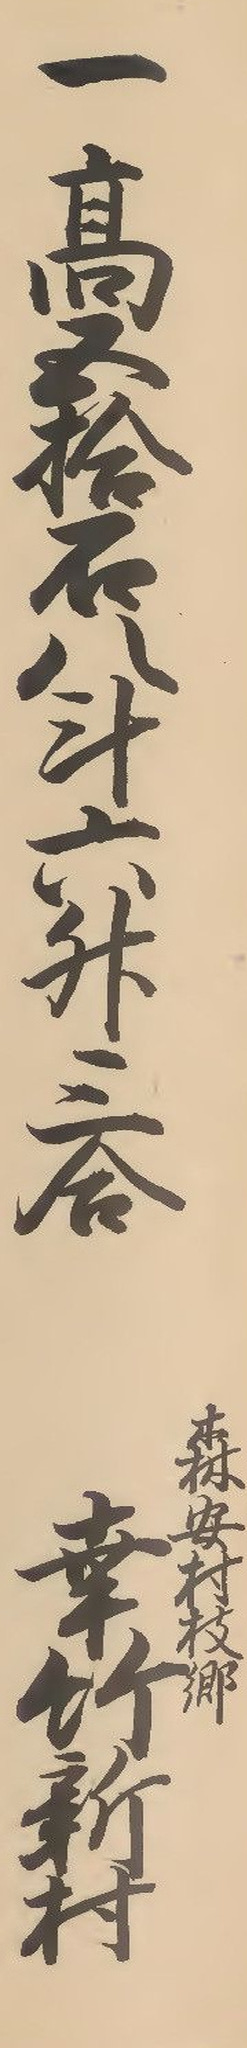一髙五拾石八斗六升三合幸竹新村
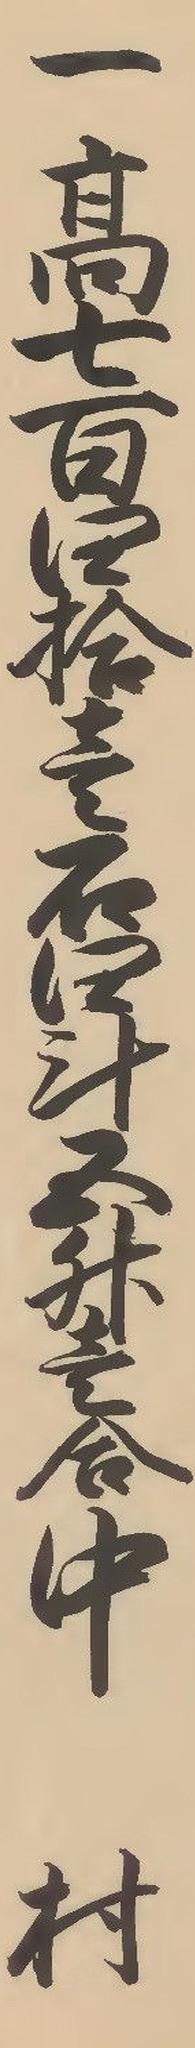一髙七百四拾壱石四斗五升壱合中村
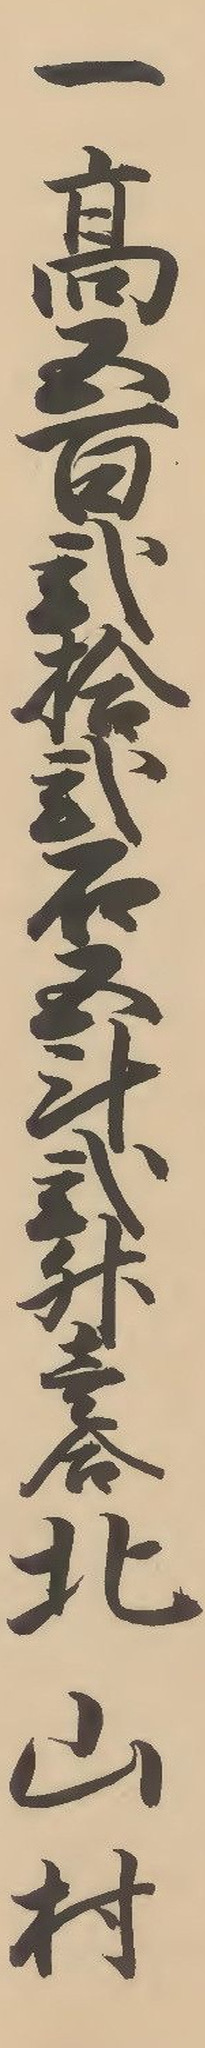一髙五百弐拾弐石五斗弐升壱合北山村
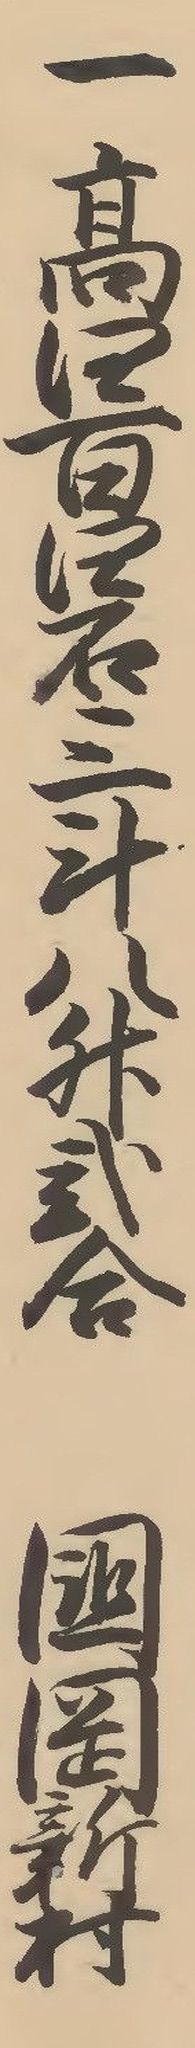一髙四百四石三斗八升弐合國岡新村
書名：播磨国郷帳
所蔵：国立公文書館 National Archives of Japan
